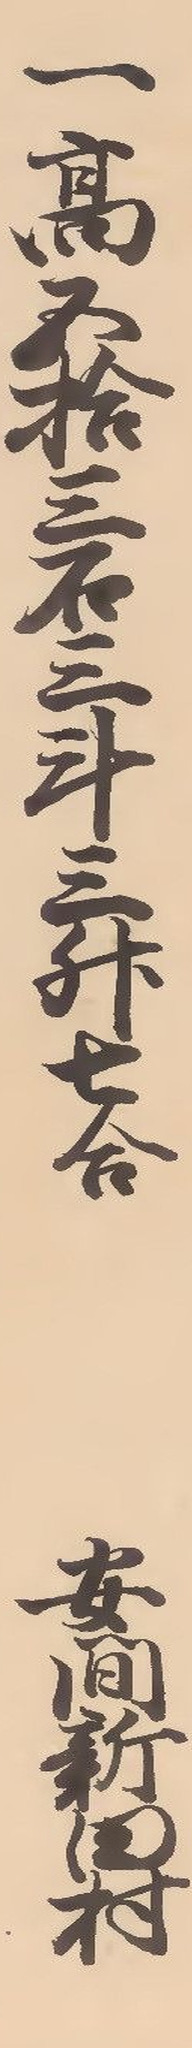一高五拾三石三斗三升七合安間新田村
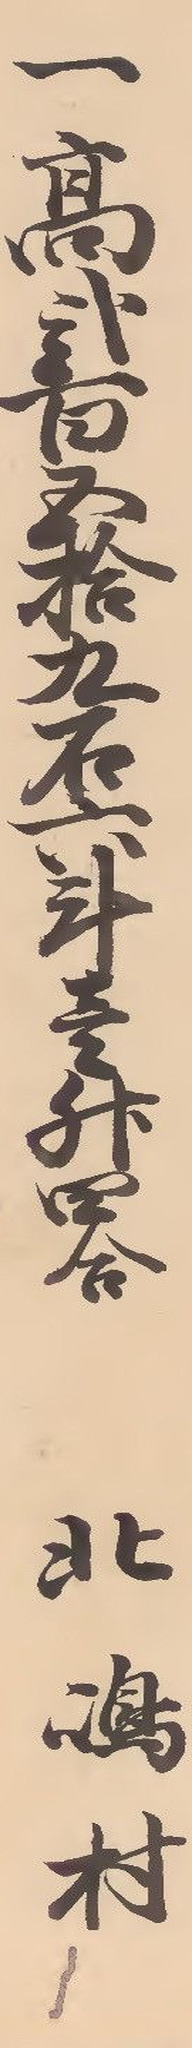一高弐百五拾九石六斗壱升四合北島村

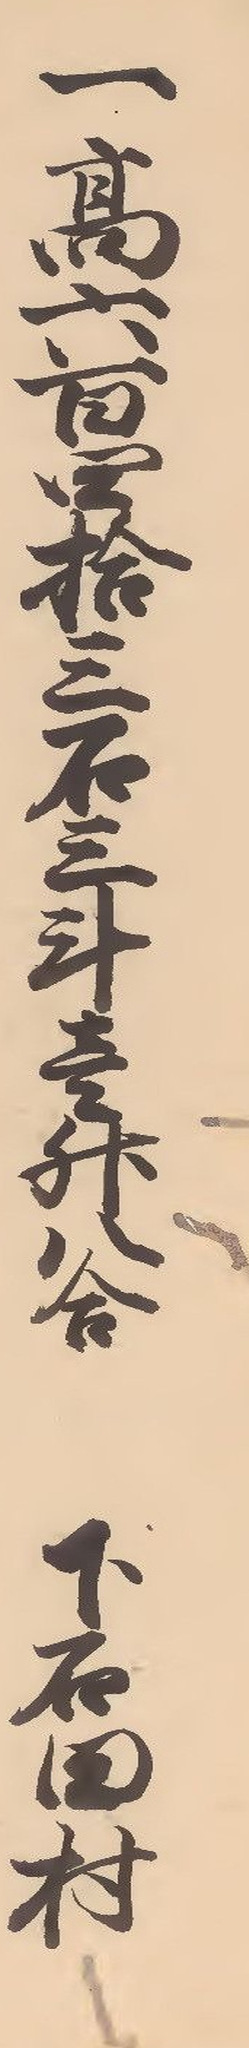一高六百四拾三石三斗壱升八合下石田村
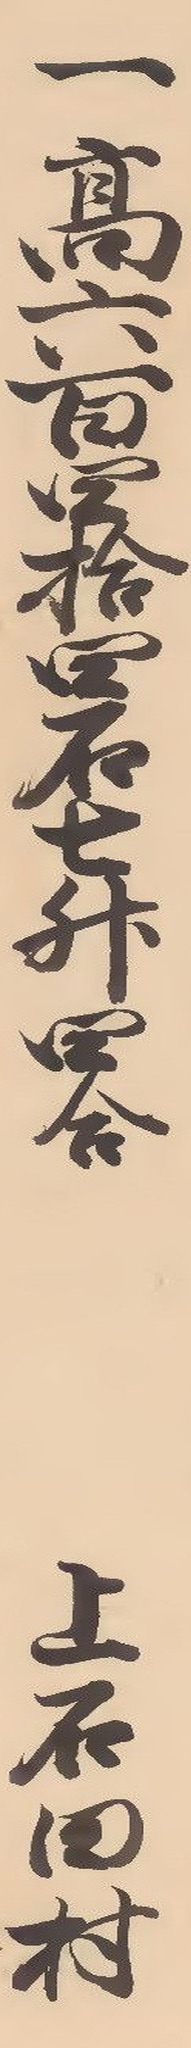一高六百四拾四石七升四合上石田村
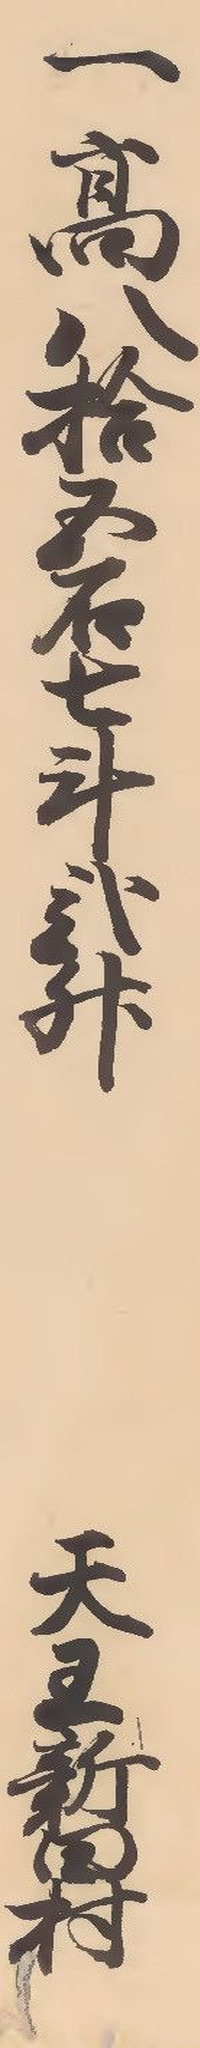一高八拾五石七斗弐升天王新田村
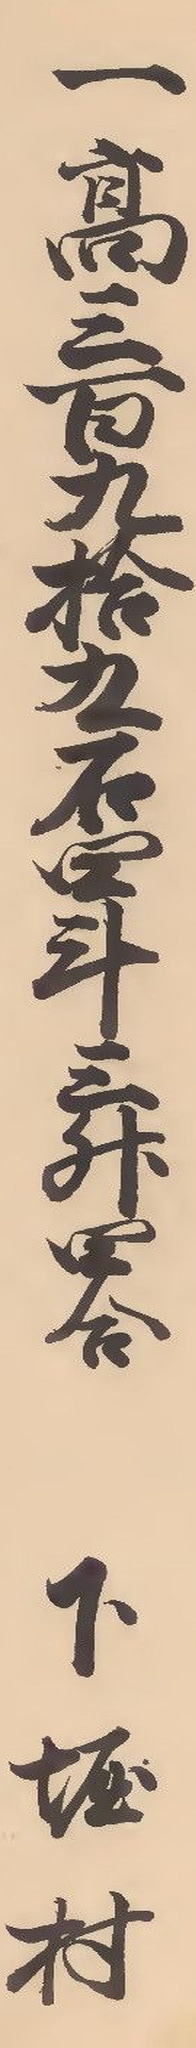一高三百九拾九石四斗三升四合下堀村
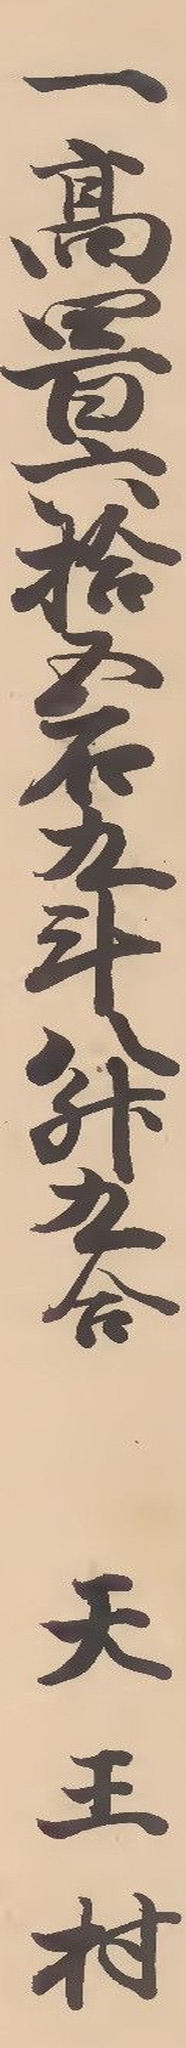一高四百六拾五石九斗八升九合天王村
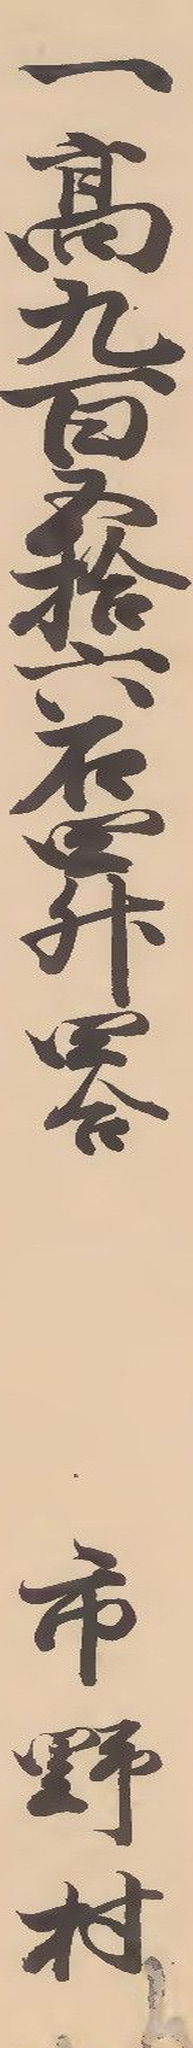一高九百五拾六石四升四合市野村
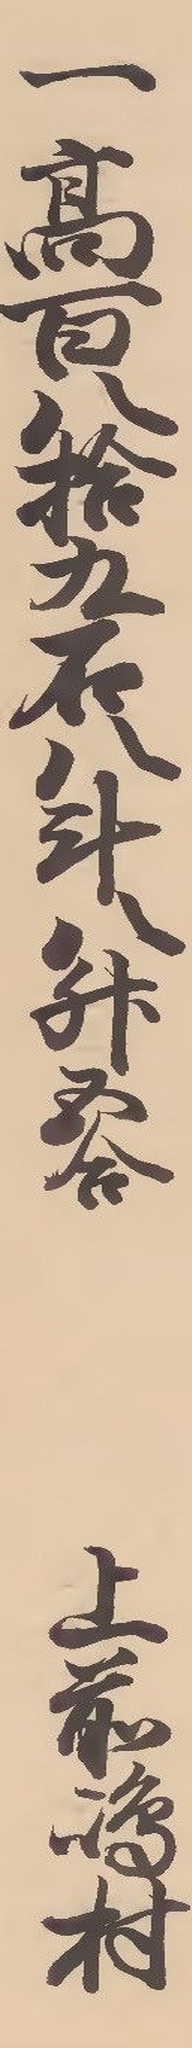一高百八拾九石八斗八升五合上前島村
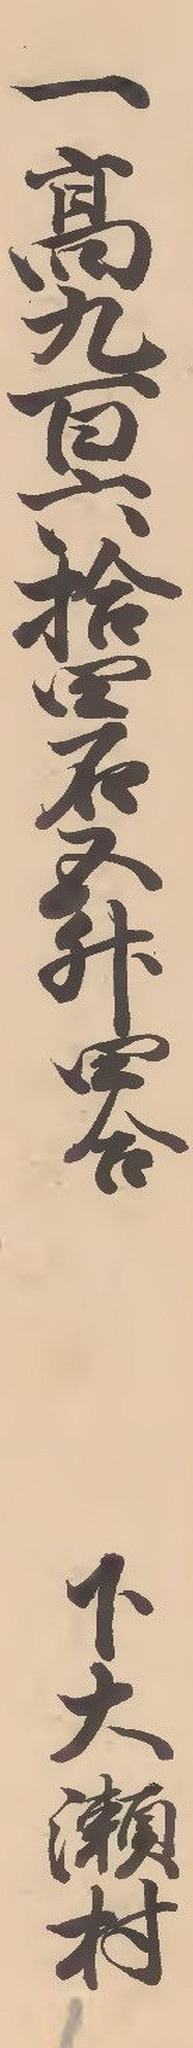一九百六拾四石五升四合下大瀬村

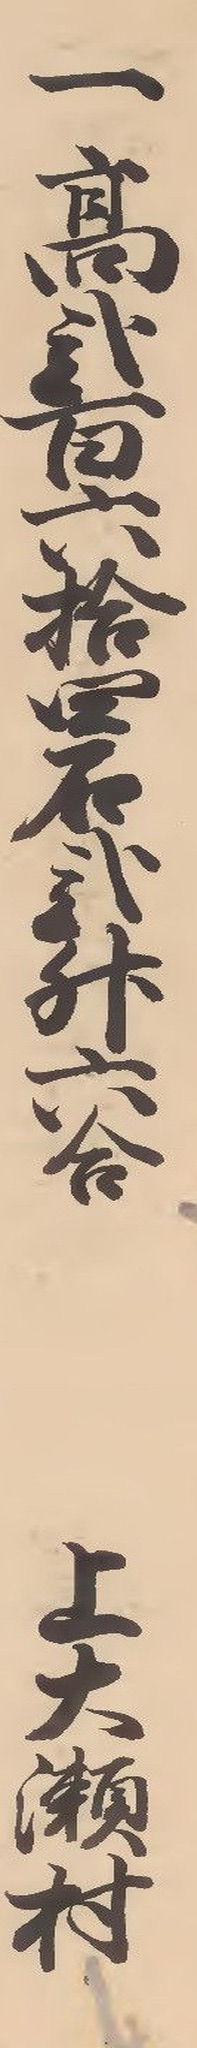一高弐百六拾四石弐升六合上大瀬村
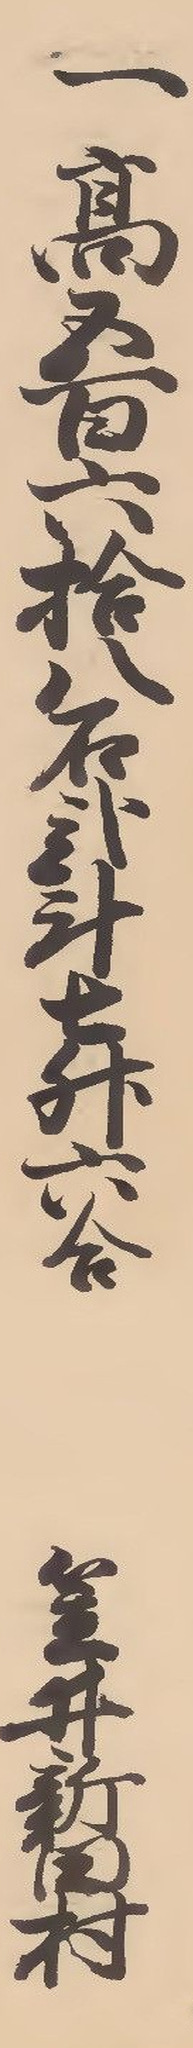一高五百六拾八石弐斗七升六合笠井新田村
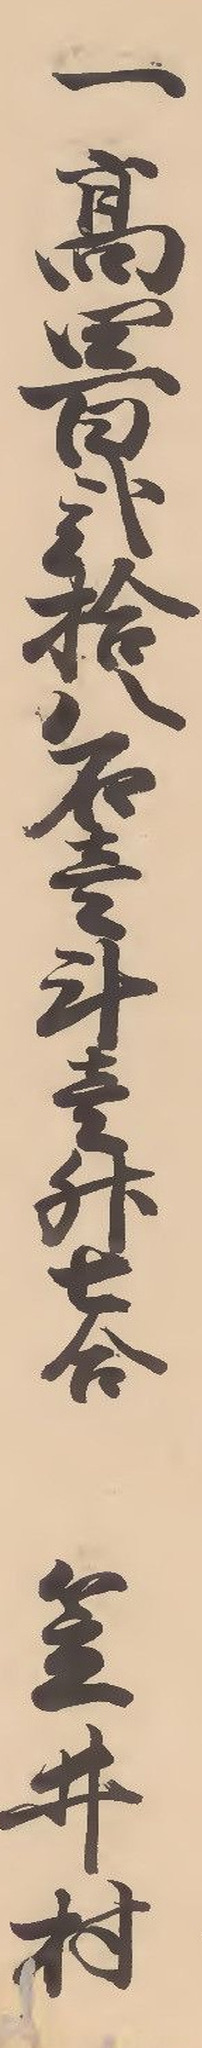一高四百弐拾八石壱斗壱升七合笠井村
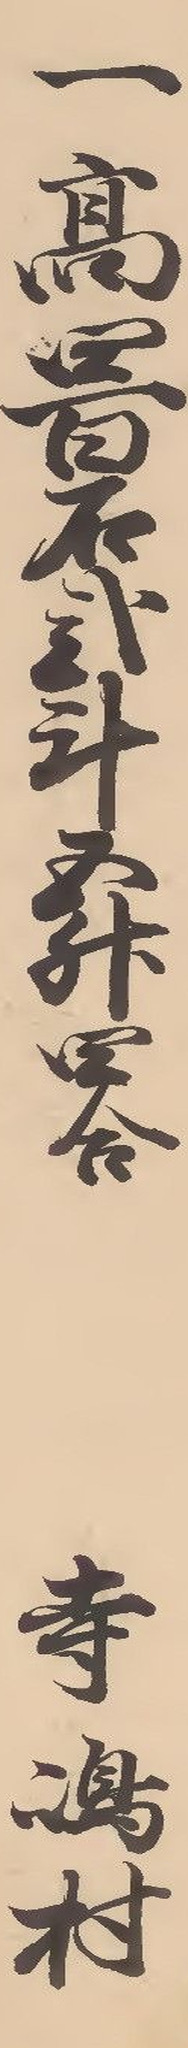一高四百石弐斗五升四合寺島村
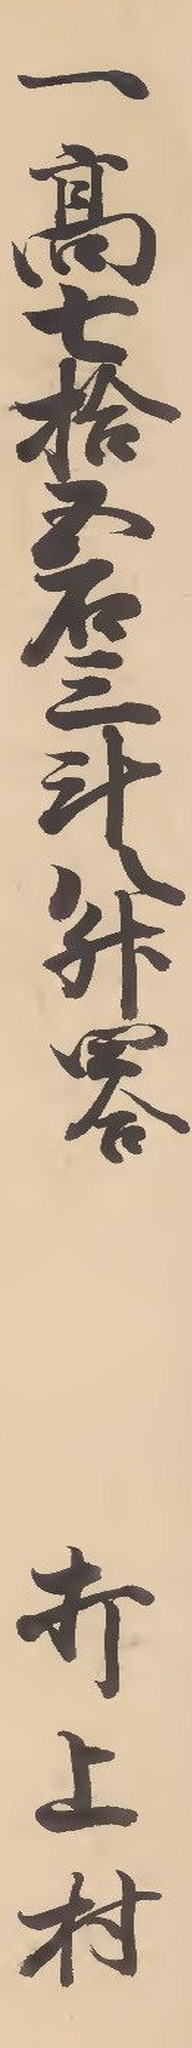一高七拾五石三斗八升四合打上村
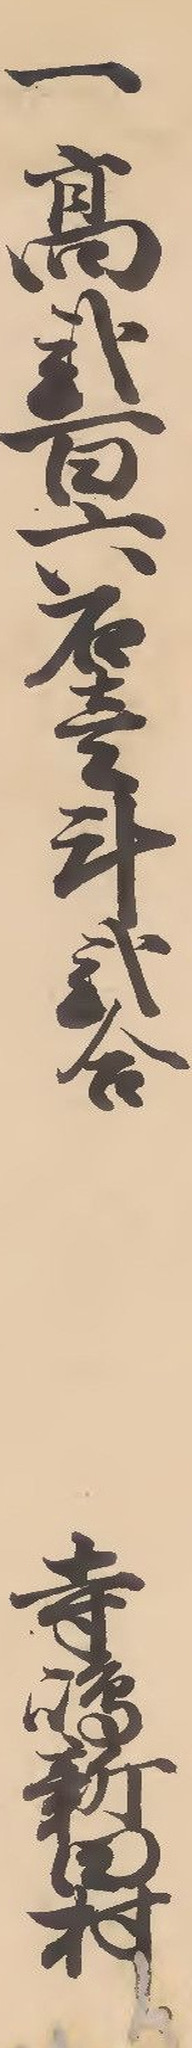一高弐百六石壱斗弐合寺島新田村
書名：遠江国郷帳
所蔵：国立公文書館 National Archives of Japan
